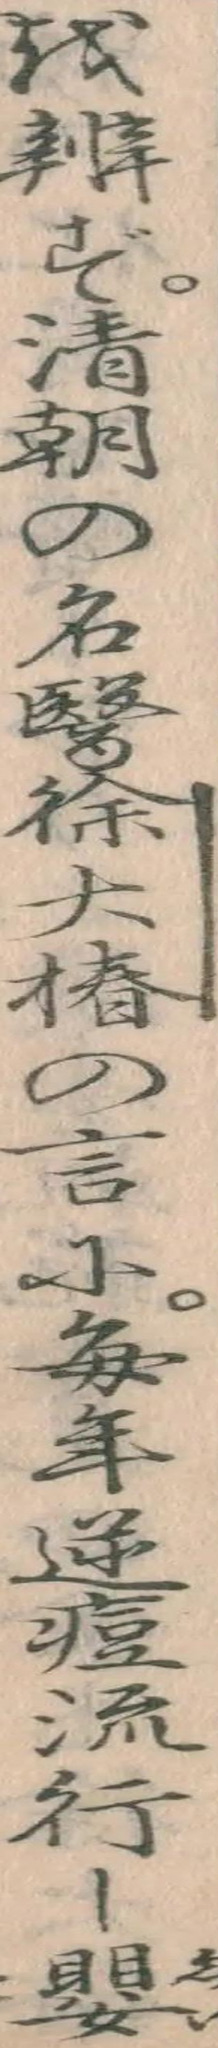を弁ず。清朝の名医徐大椿の言に。毎年逆痘流行し嬰
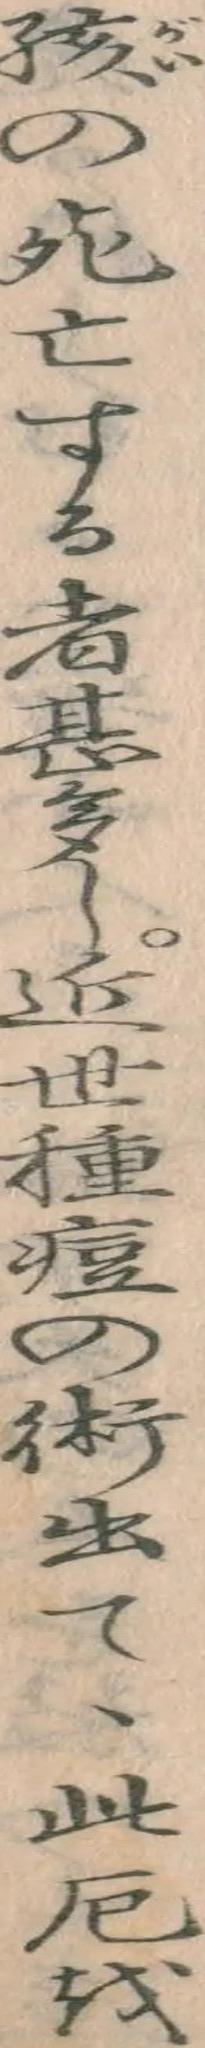孩の死亡する者甚多し。近世種痘の術出てゝこの厄を

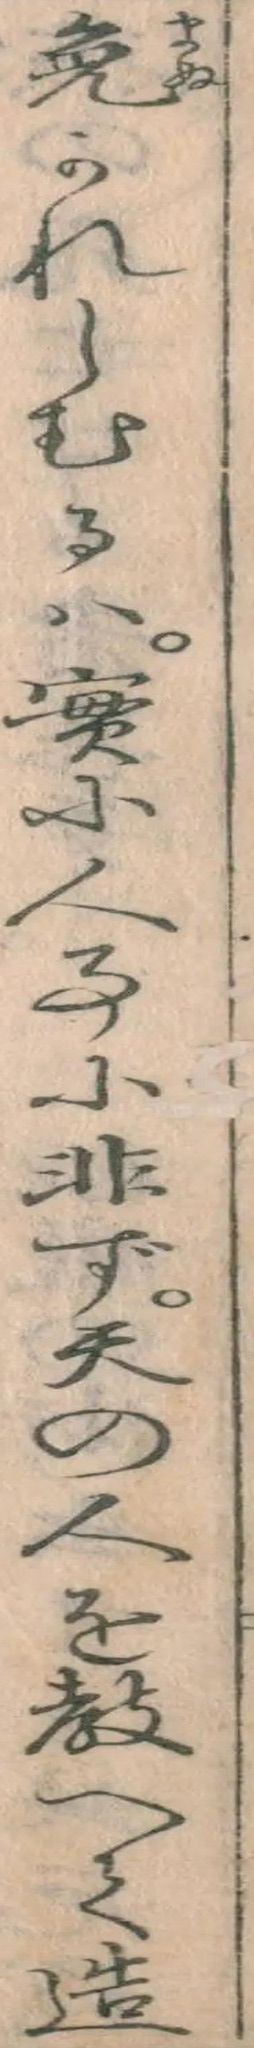免かれしむるは。実に人事に非ず。天の人を教へて造
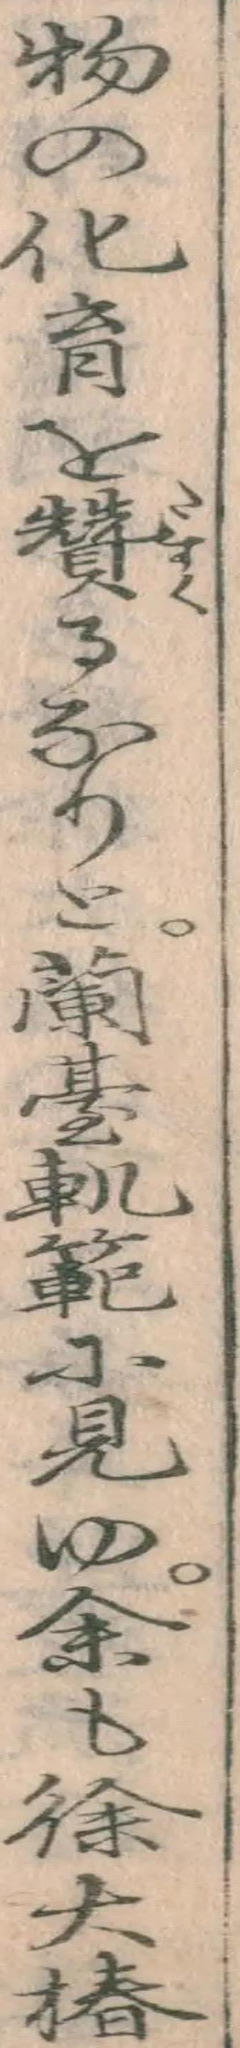物の化育を賛るなりと。蘭台軌範に見ゆ。余も徐大椿
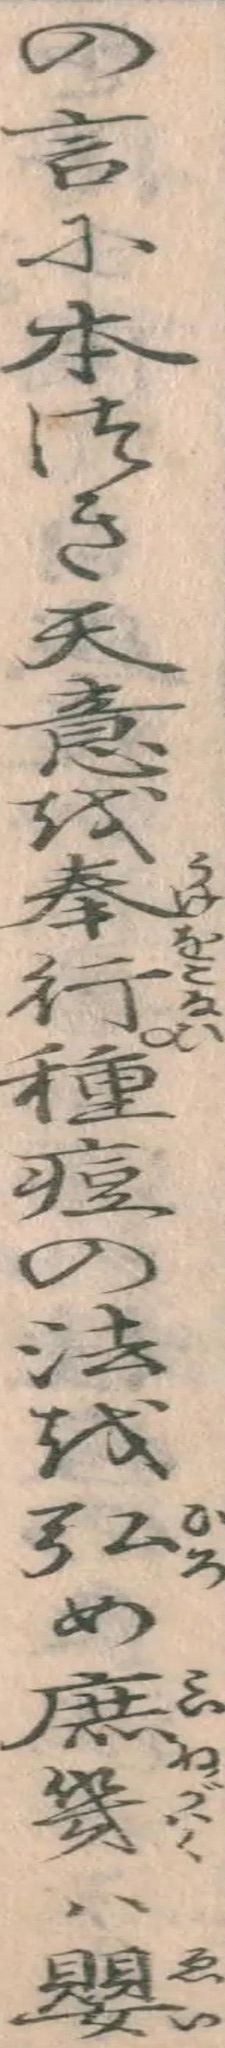の言に本つき天意を奉行。種痘の法を弘め庶幾は嬰
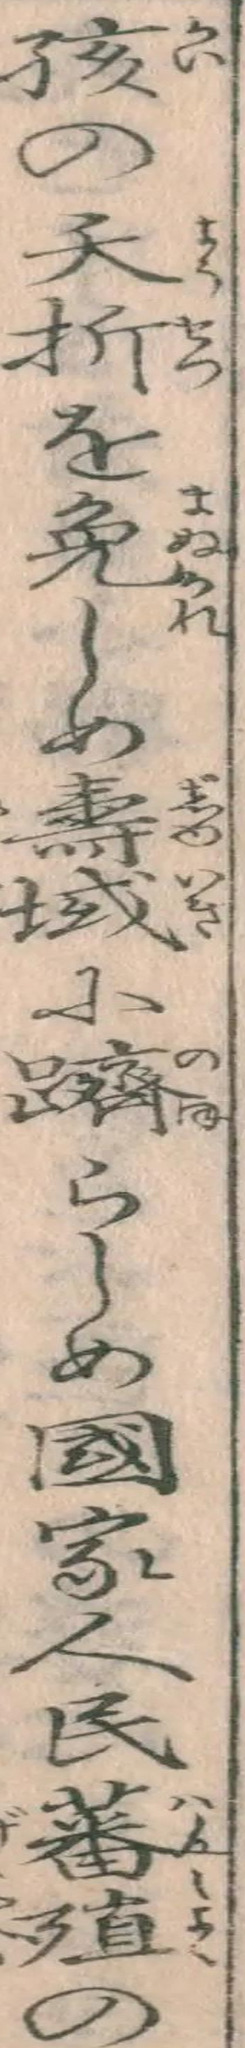孩の夭折を免しめ寿域に躋らしめ国家人民蕃殖の
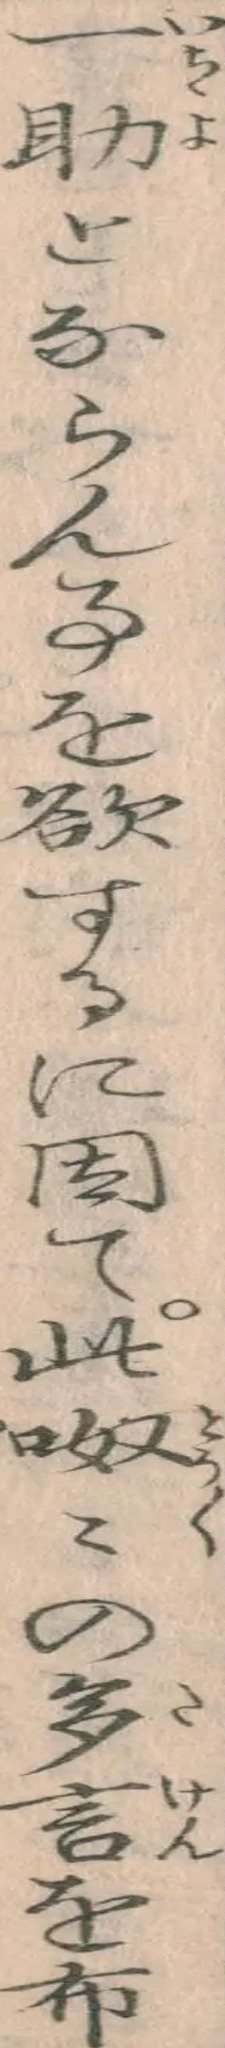一助とならん事を欲するに因て。此呶々の多言を布
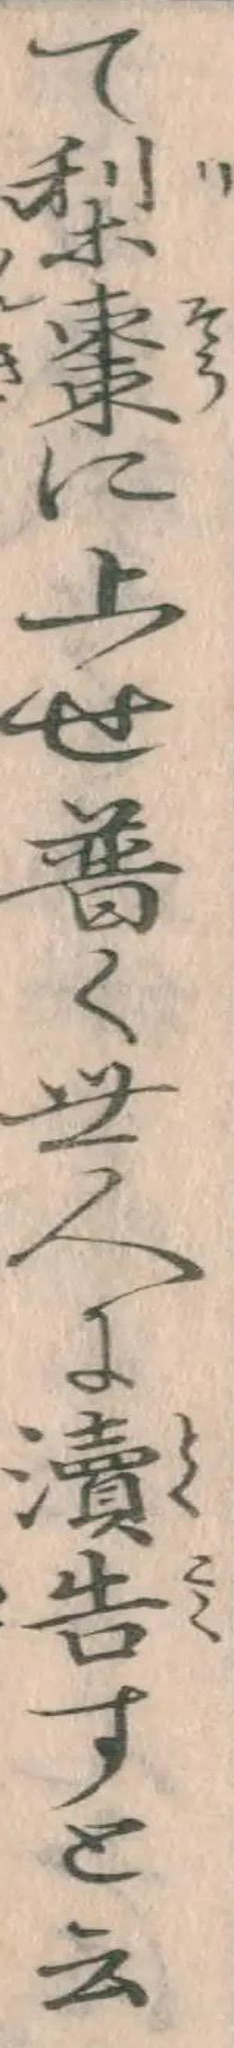て梨棗に上せ普く世人に瀆告すと云
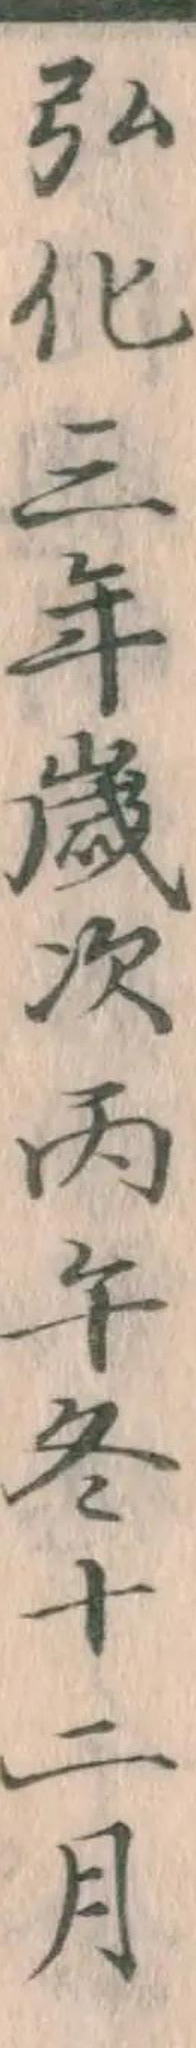弘化三年歳次丙午冬十二月
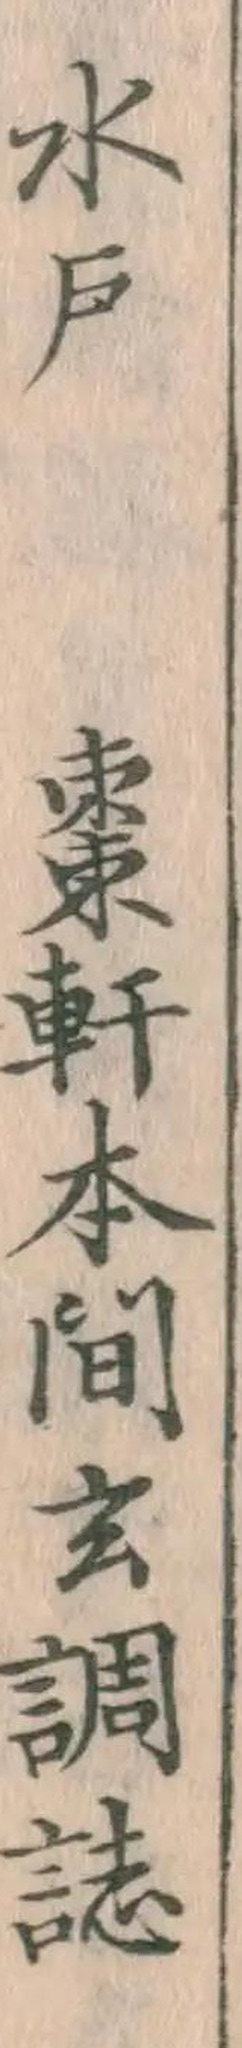水戸棗軒本間玄調誌
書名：種痘活人十全辯
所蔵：国立国会図書館 National Diet Library, JAPAN
